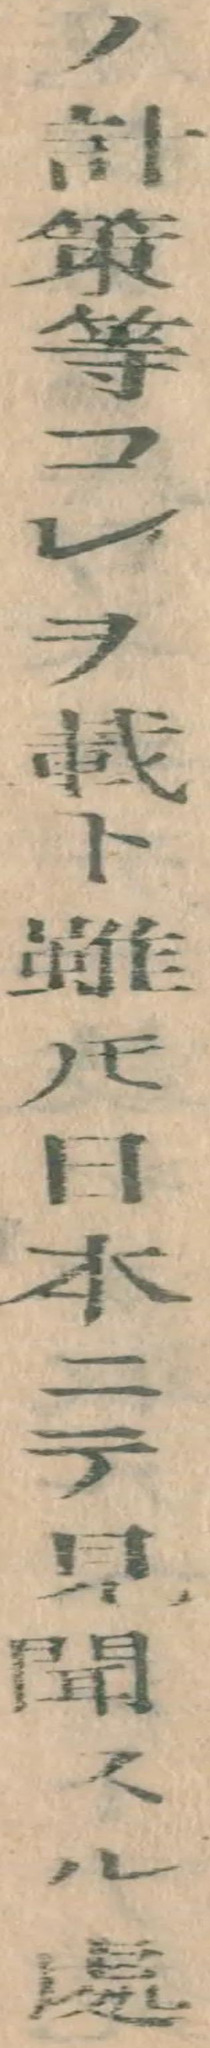ノ計策等コレヲ載ト雖トモ日本ニテ見聞スル処
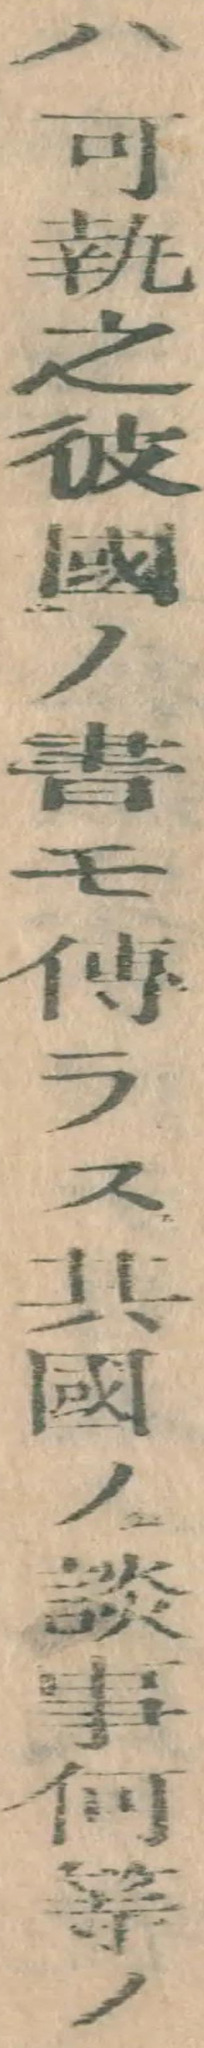ハ可執之彼国ノ書モ伝ラス其国ノ談事何等ノ
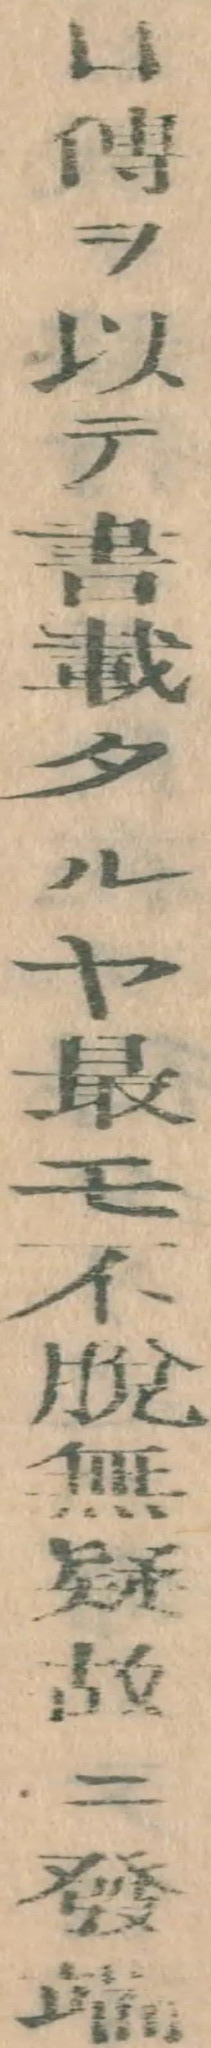口伝ヲ以テ書載タルヤ最モ不脱無疑故ニ発端
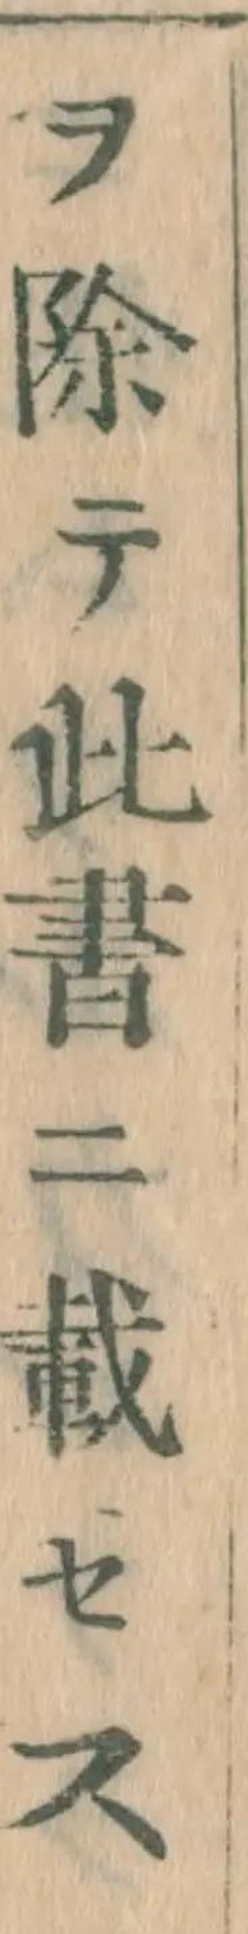ヲ除テ此書ニ載セス
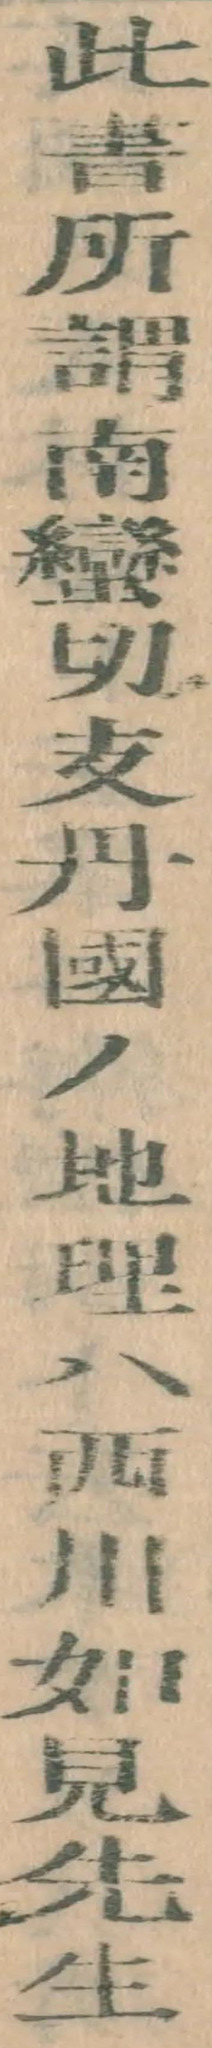此書所謂南蛮切支丹国ノ地理ハ西川如見先生
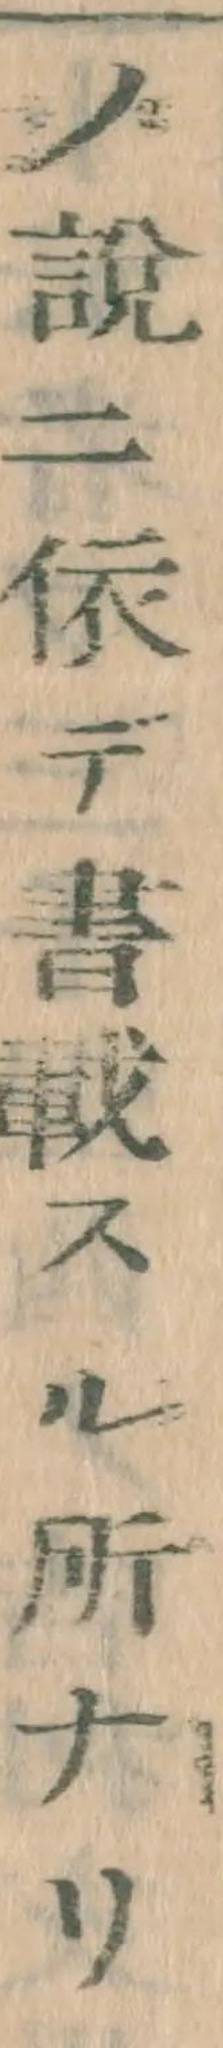ノ説ニ依テ書載スル所ナリ
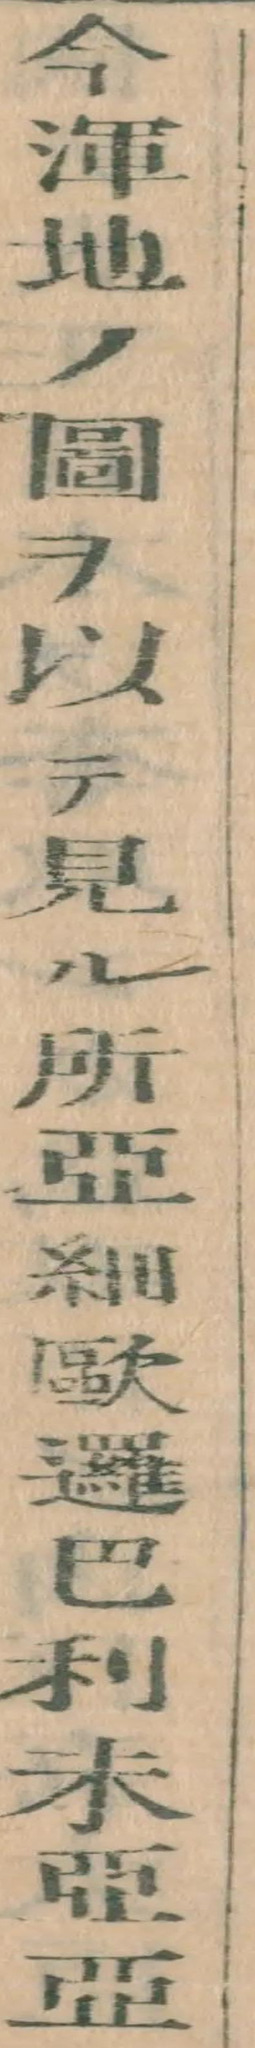今渾地ノ図ヲ以テ見ル所亜細欧邏巴利未亜亜
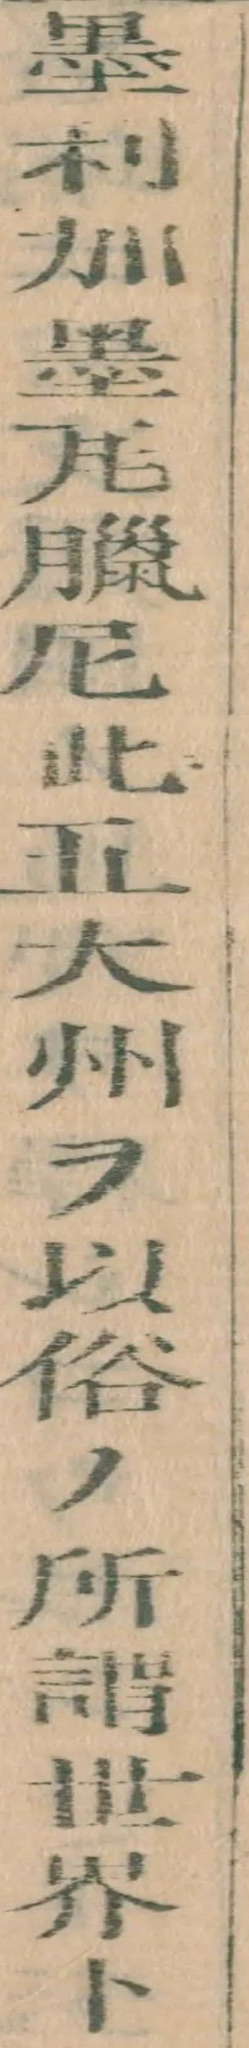墨利加墨瓦臘尼此五大州ヲ以俗ノ所謂世界ト
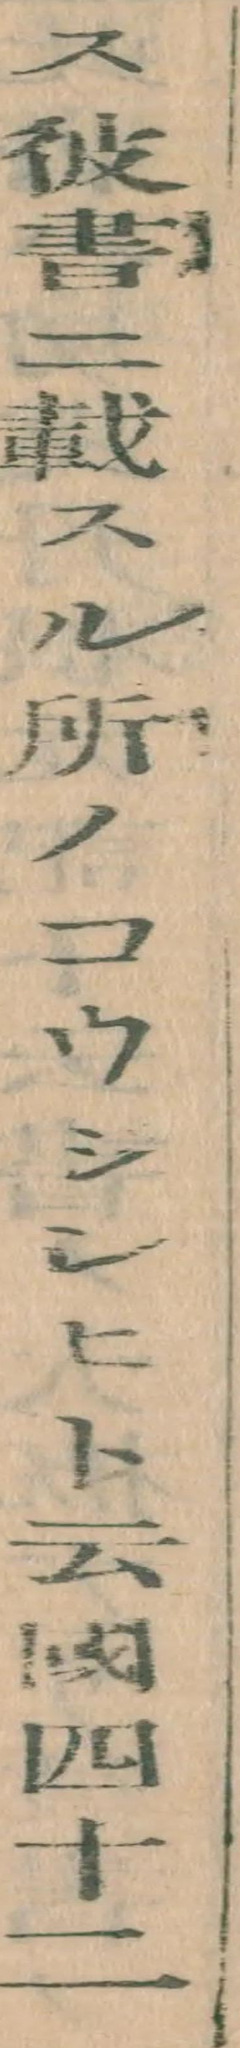ス彼書ニ載スル所ノコウシンヒト云国四十二
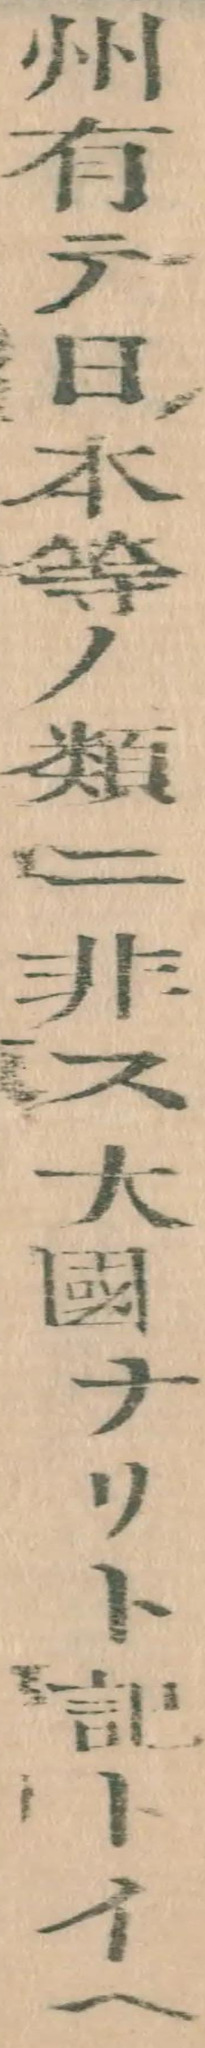州有テ日本等ノ類ニ非ス大国ナリト記トイヘ
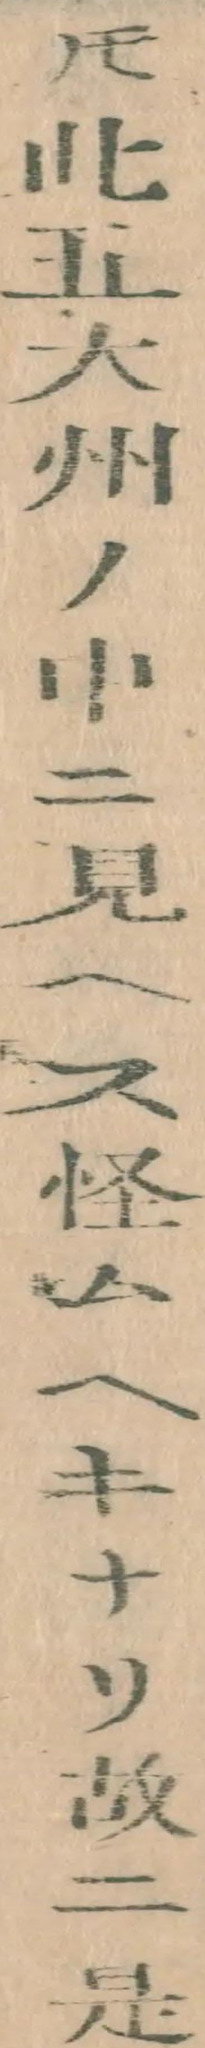トモ此五大州ノ中ニ見ヘス怪ムヘキナリ故ニ是
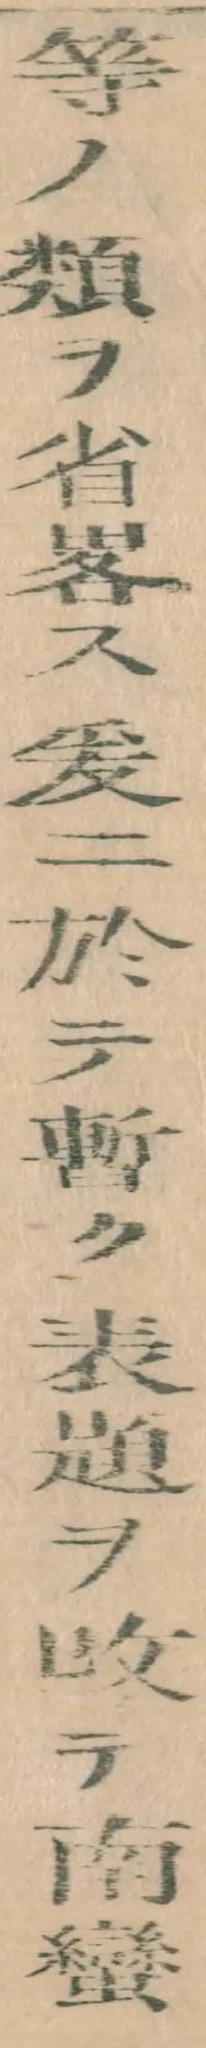等ノ類ヲ省略ス爰ニ於テ暫ク表題ヲ改テ南蛮
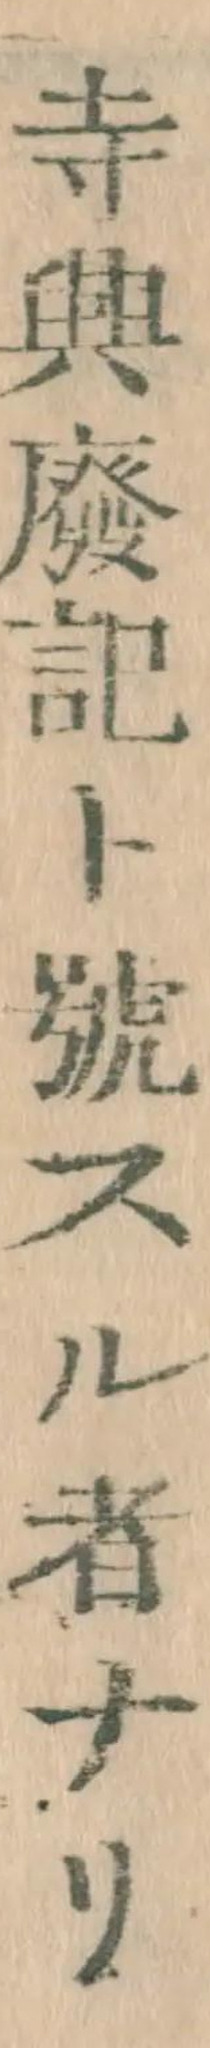寺興廃記ト号スル者ナリ

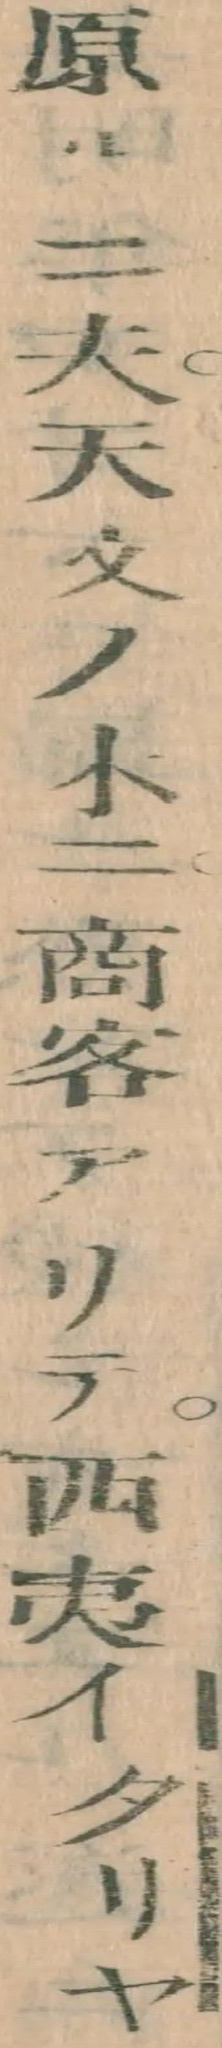原ルニ夫。天文ノ末ニ商客アリテ。西夷イタリヤ
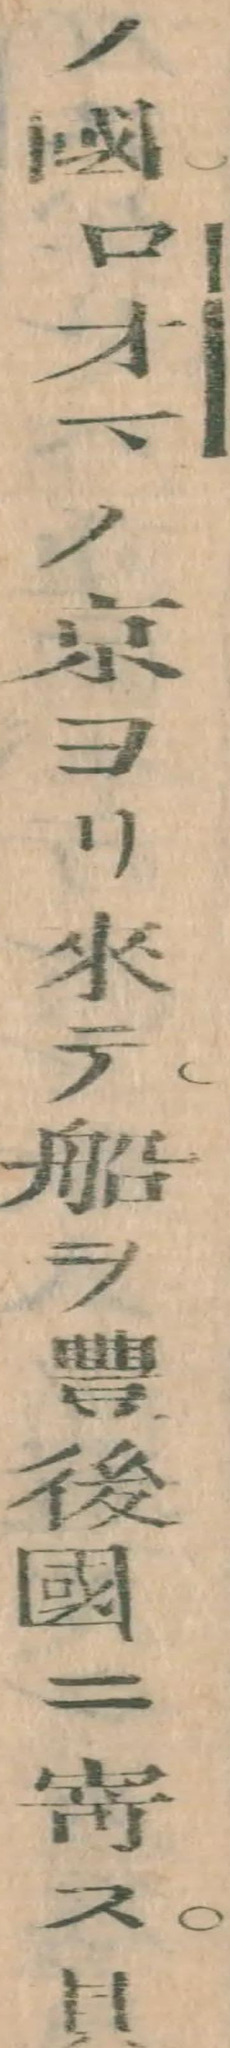ノ国ロオマノ京ヨリ来テ。船ヲ豊後国ニ寄ス。其
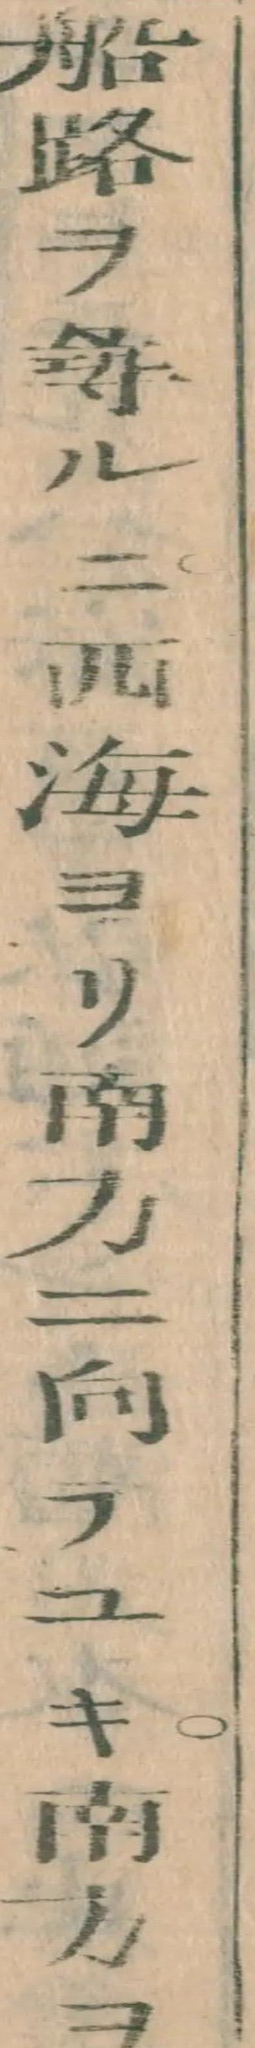船路ヲ尋ルニ西海ヨリ南方ニ向テユキ。南方ヨ
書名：南蛮寺興廃記
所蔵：国立国会図書館 National Diet Library, JAPAN
